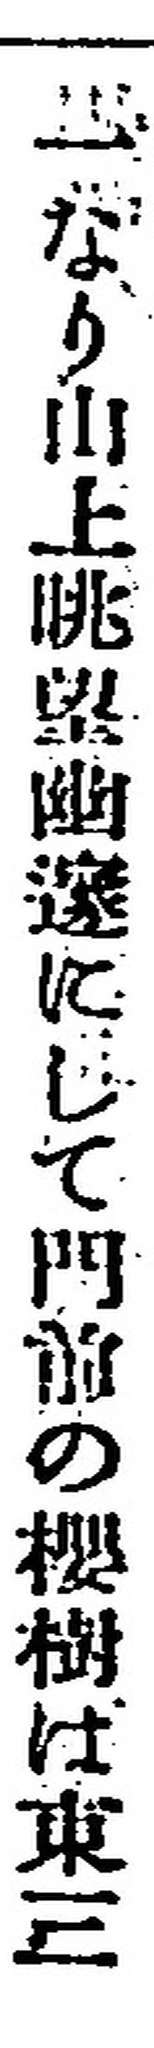一なり山上眺望幽邃にして門前の桜樹は東三
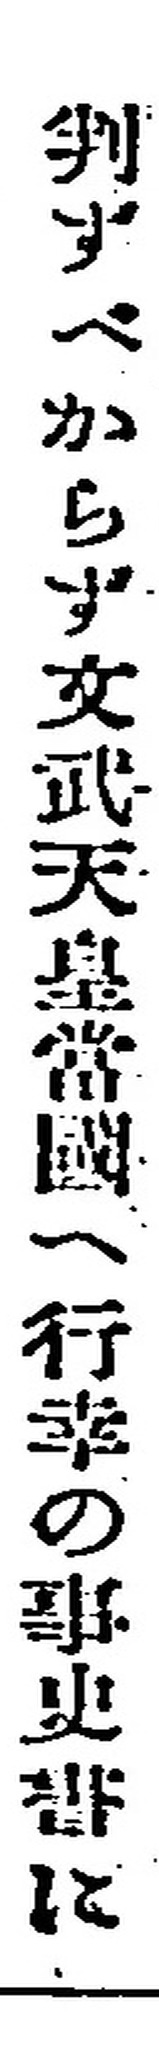判ずべからず文武天皇当国へ行幸の事史書に
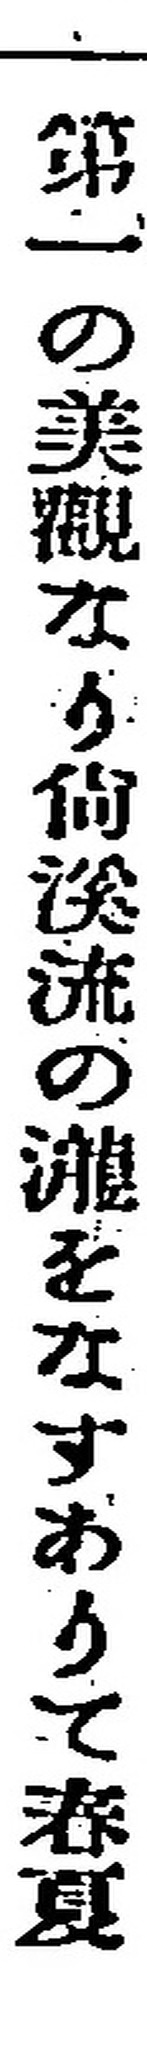第一の美観なり尚渓流の瀧をなすありて春夏
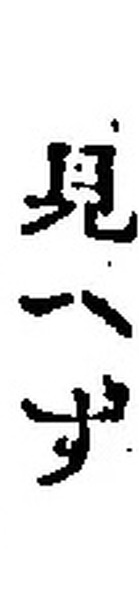見へず
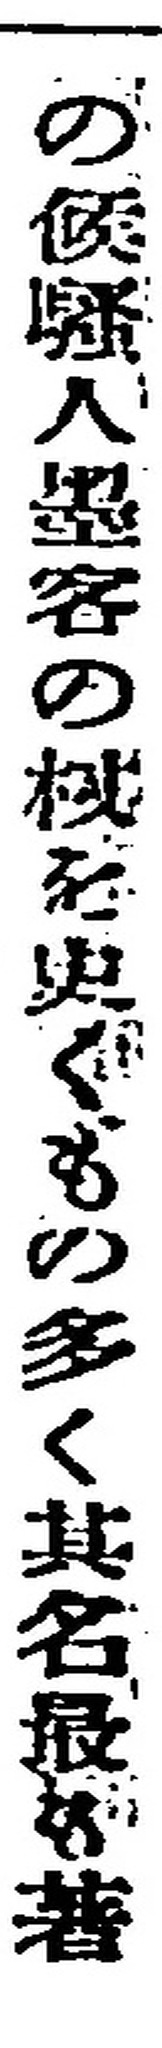の候騒人墨客の杖を曳くもの多く其名最も著
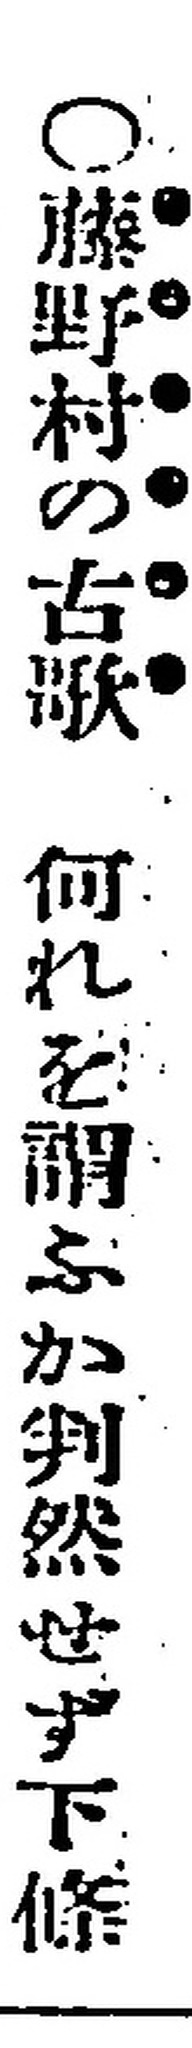○藤野村の古歌何れを謂ふか判然せず下條
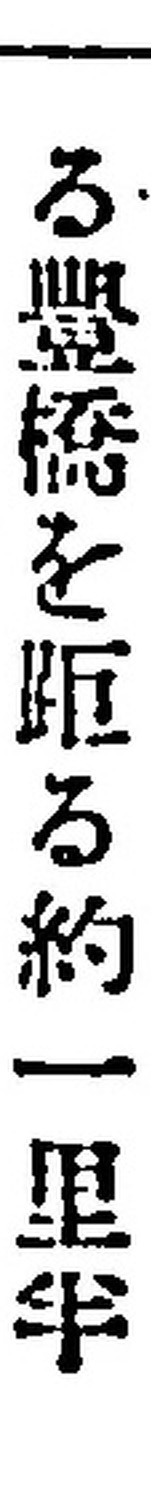る豊橋を距る約一里半
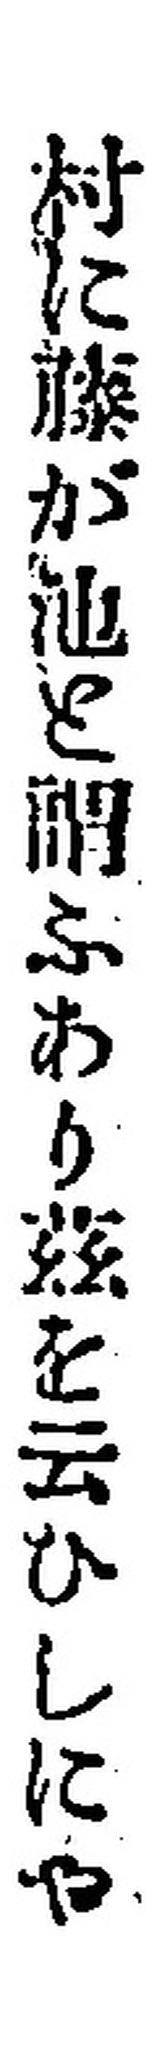村に藤が池と謂ふあり茲を云ひしにや
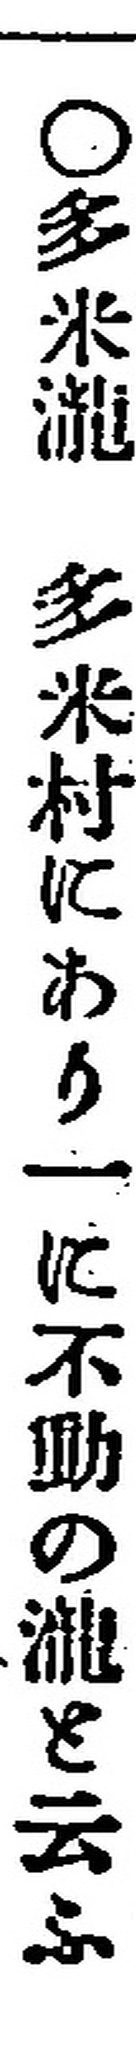○多米瀧多米村にあり一に不動の瀧と云ふ
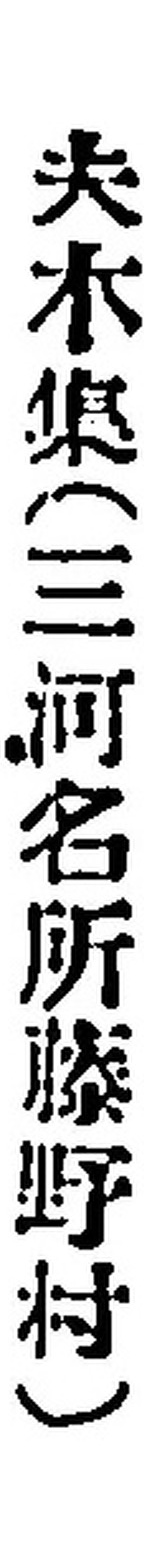夫木集(三河名所藤野村)
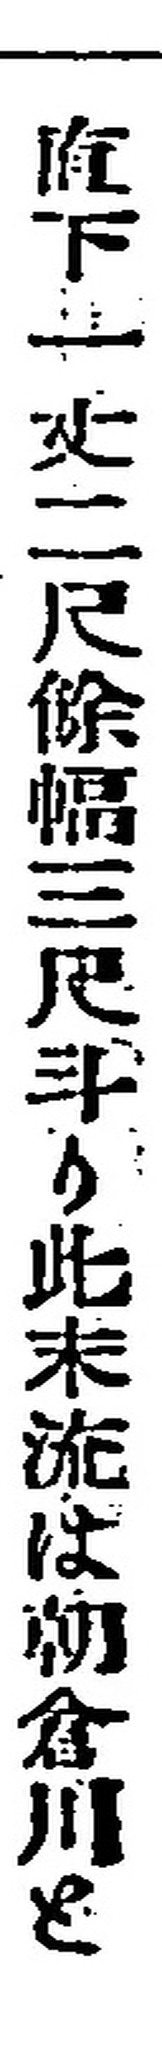直下一丈二尺余幅三尺斗り此末流は朝倉川と
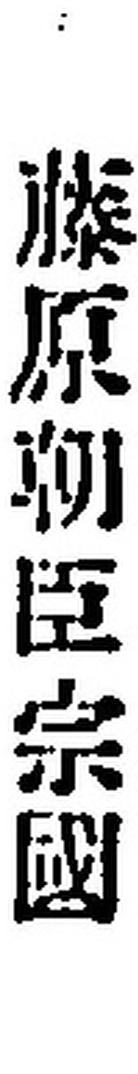藤原朝臣宗国
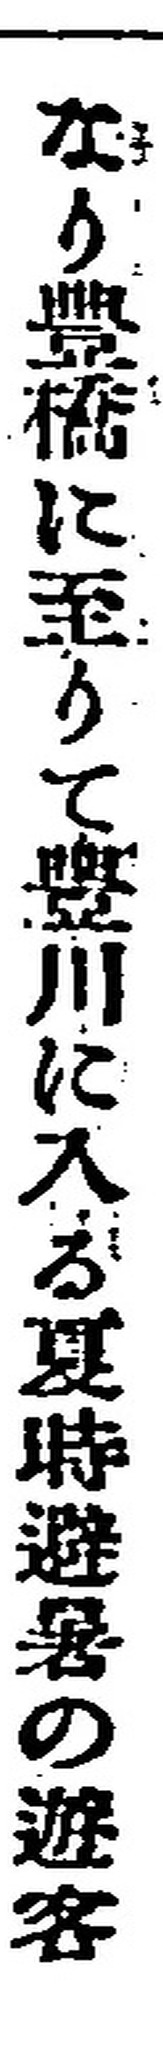なり豊橋に至りて豊川に入る夏時避暑の遊客
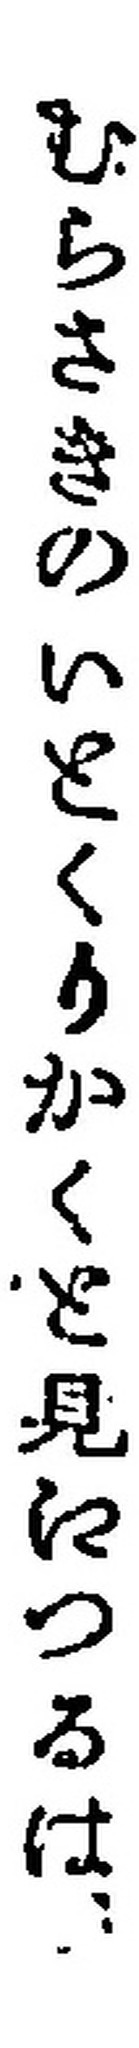むらさきのいとくりかくと見えつるは
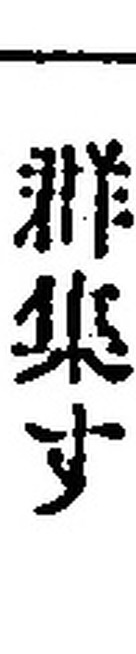群集す
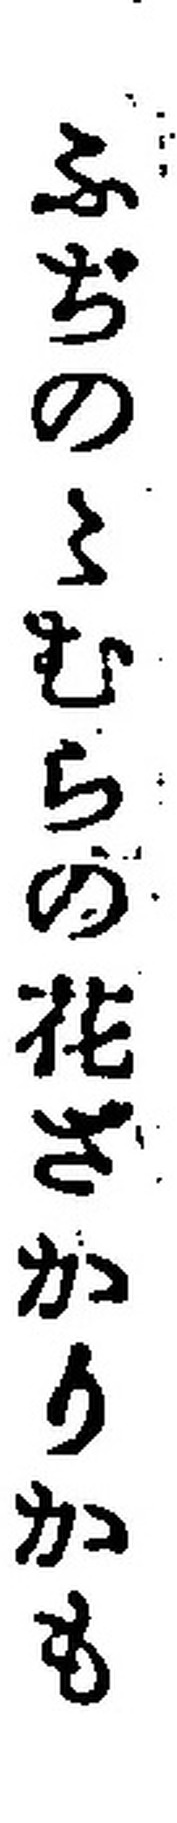ふぢのゝむらの花ざかりかも
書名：東参名勝案内
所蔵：国立国会図書館 National Diet Library, JAPAN
